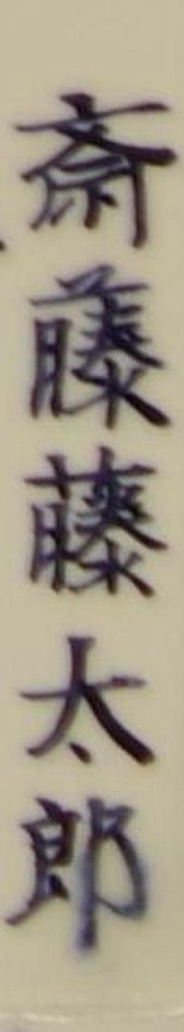斎藤藤太郎
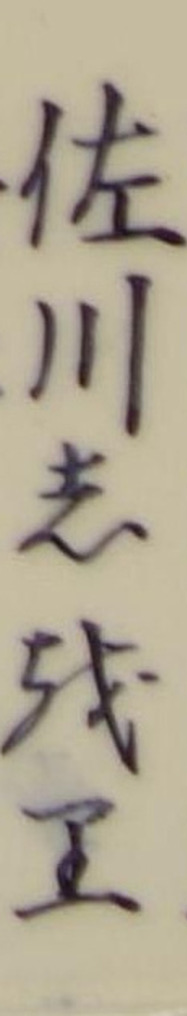佐川しをり
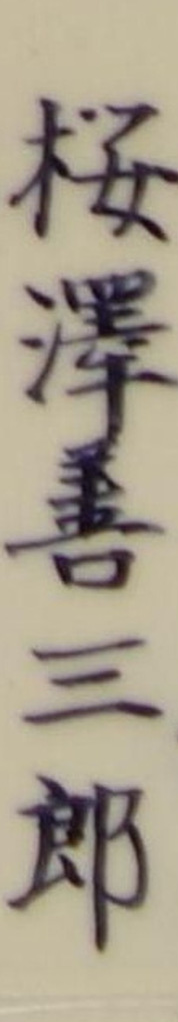梅澤善三郎
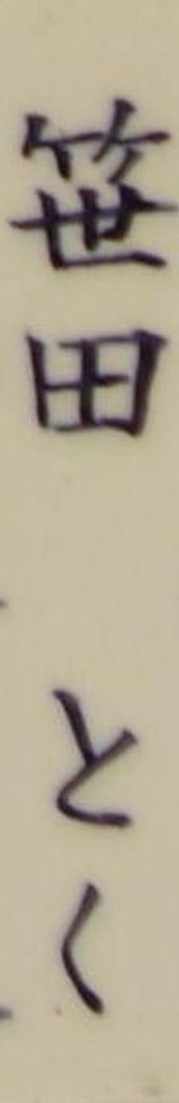笹田とく
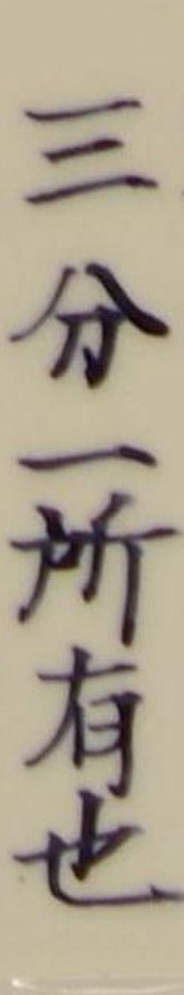三分一所有也
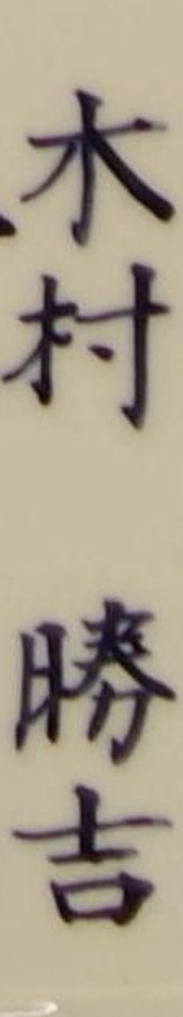木村勝吉
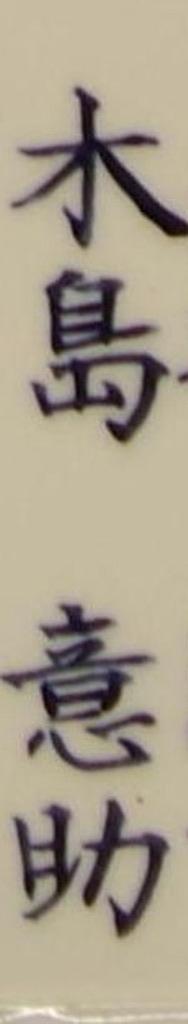木島意助
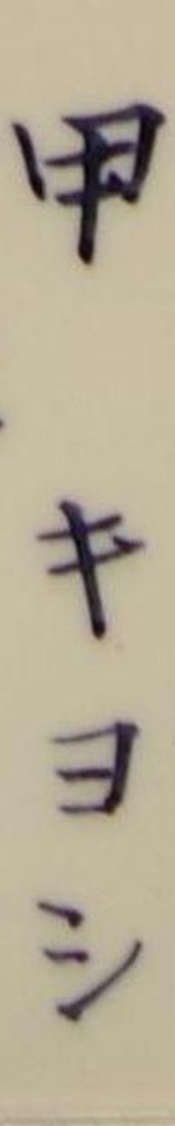甲キヨシ
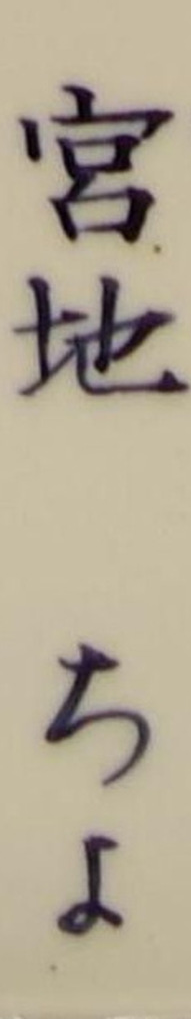宮地ちよ
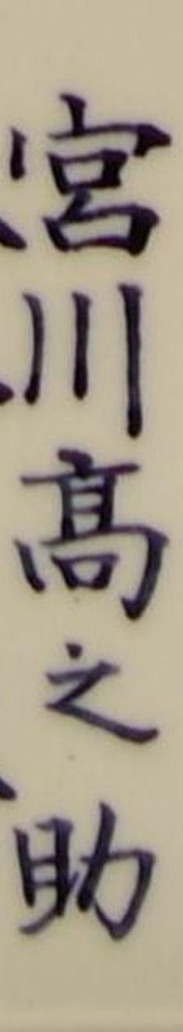宮川高之助
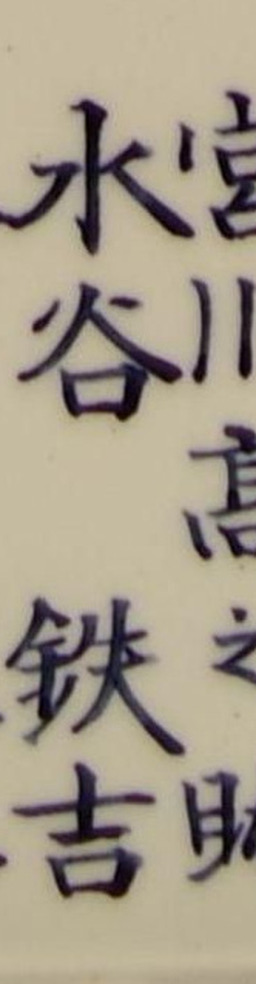水谷鉄吉
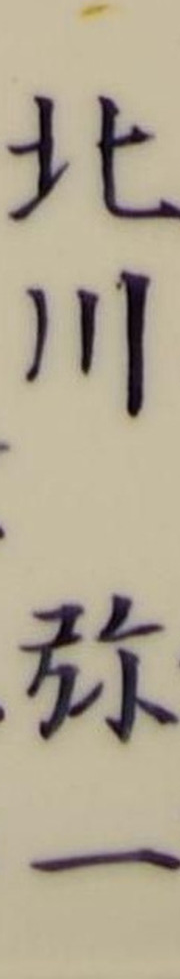北川弥一
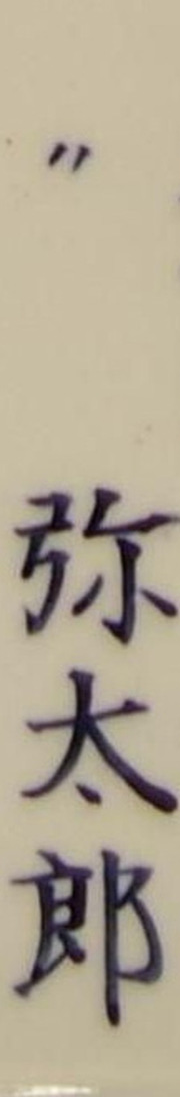弥太郎
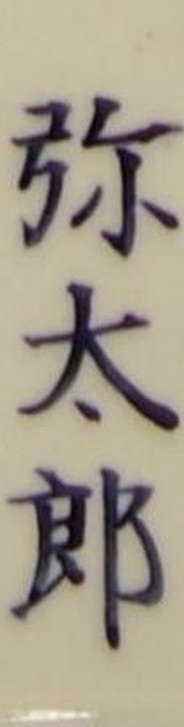弥太郎
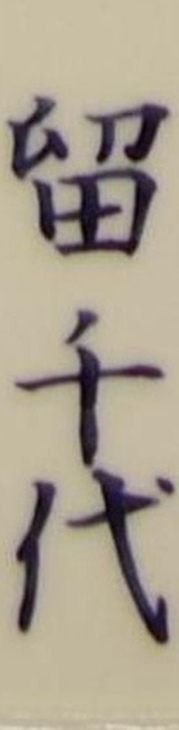留千代
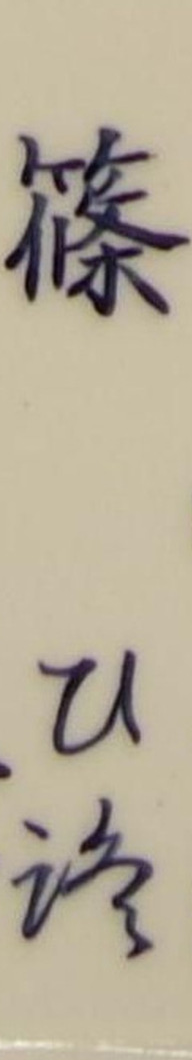篠ひろ
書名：A~D
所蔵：koyasan kongobuji
